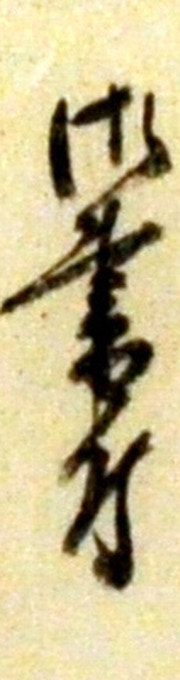御書付
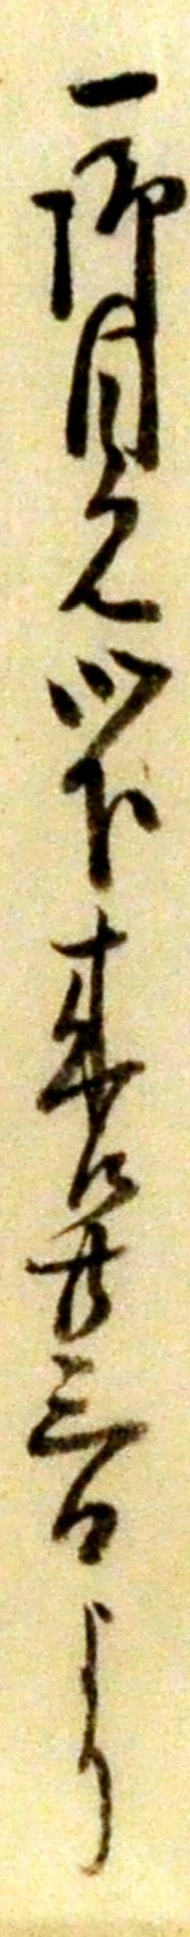一御目見以下来候廿三日より
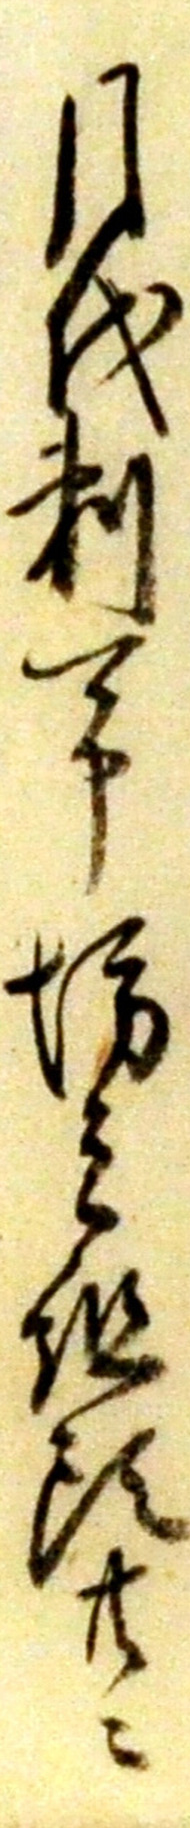月代剃可申坊主組頭共ニ
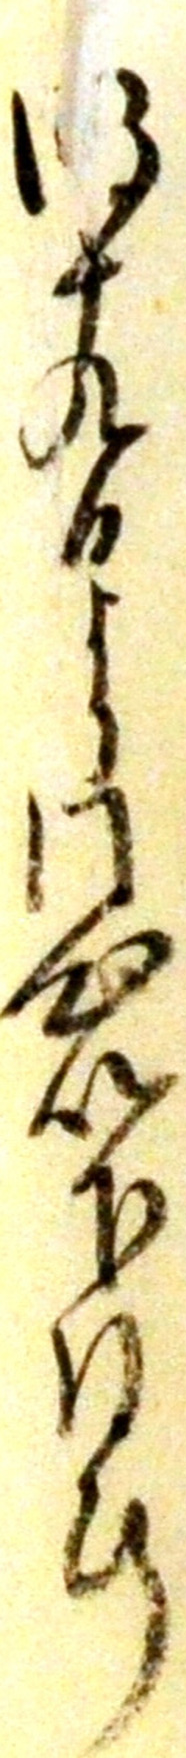明十九日より同心以下同断

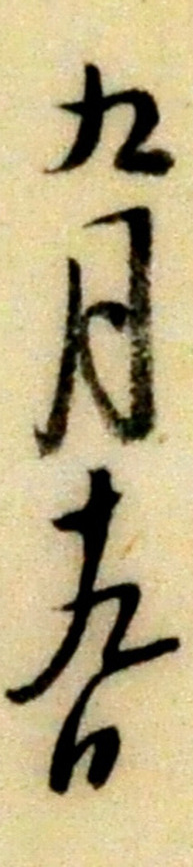九月十九日
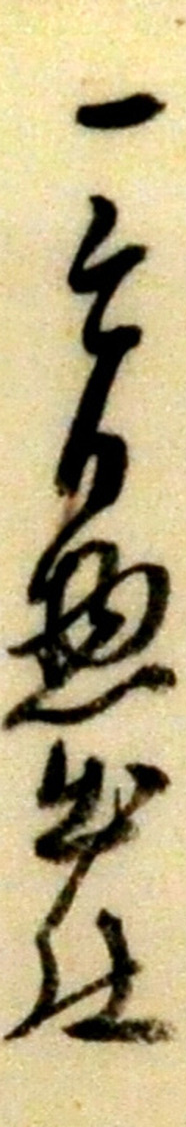一今日惣出仕
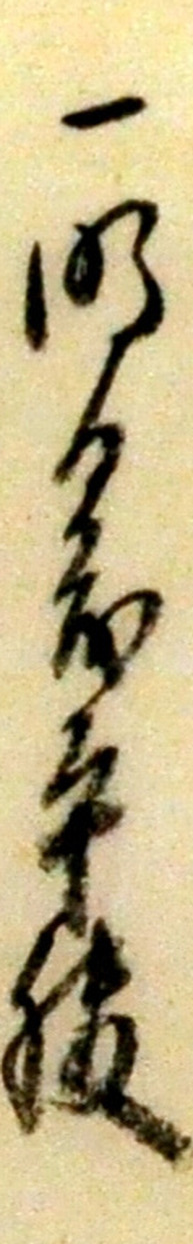一明日茂平服
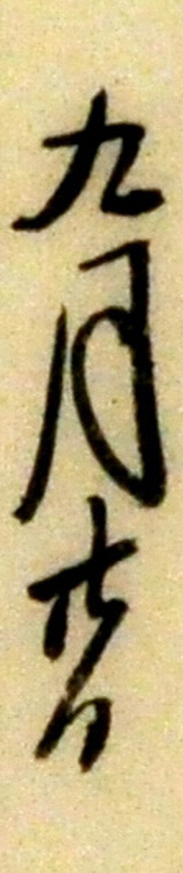九月廿日
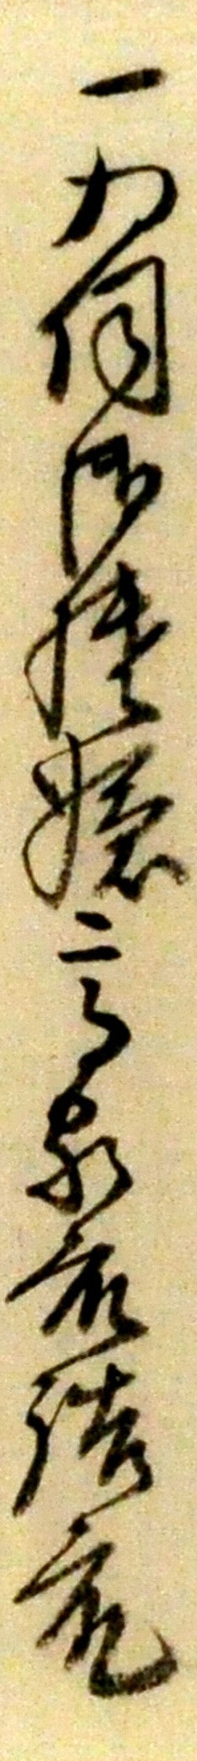一為伺御機嫌高家衆詰衆
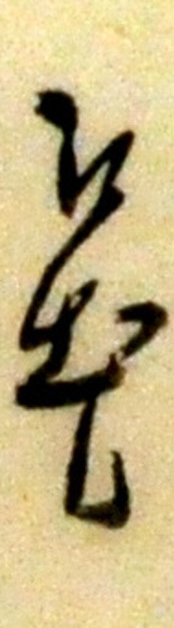被出候
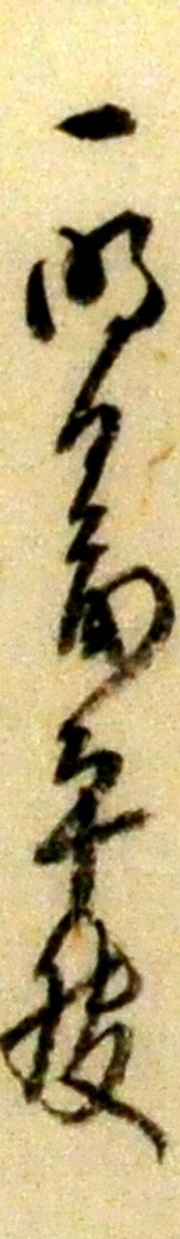一明日茂平服
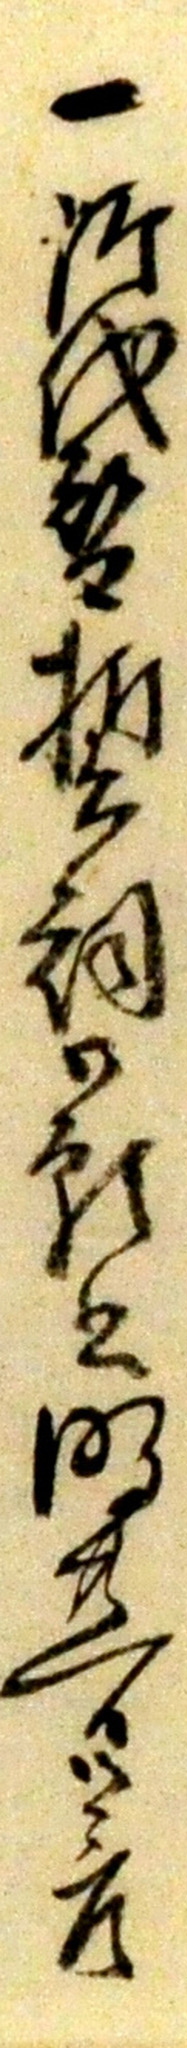一御代替誓詞御願書明廿一日御差
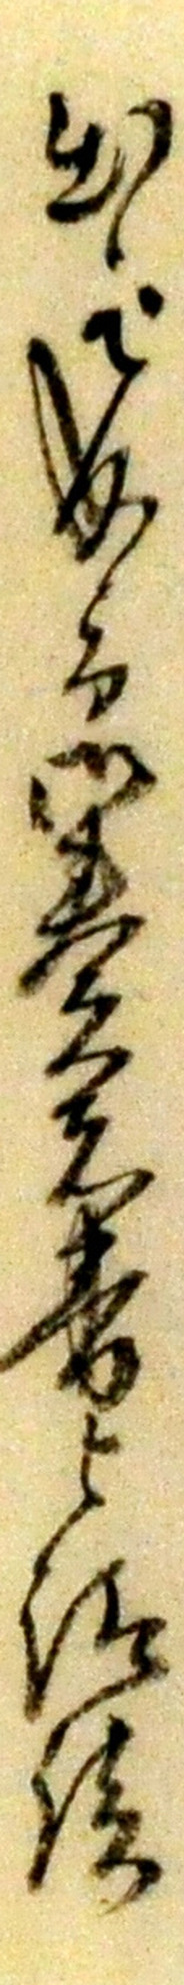出可被成旨御奏者番被仰談
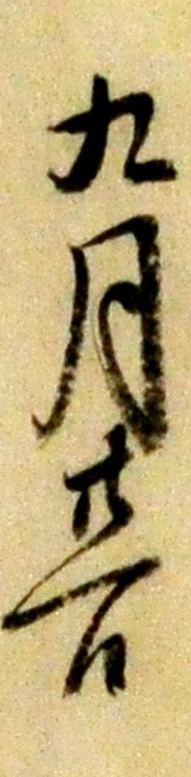九月廿一日
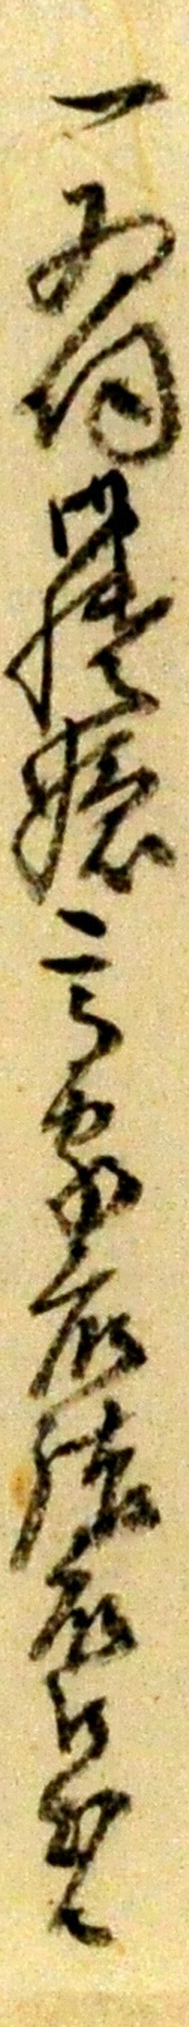一為伺御機嫌高家衆詰衆被出候
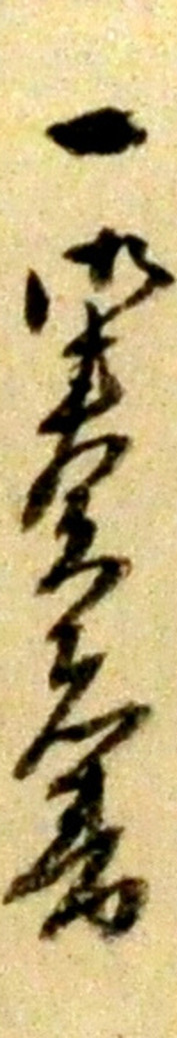一御奏者番
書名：書抜
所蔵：伊那市立高遠町図書館・合同会社AMANE
